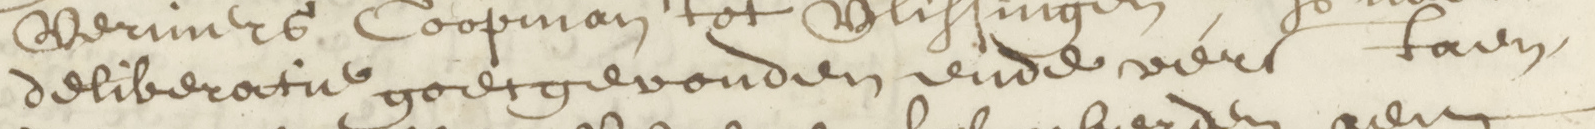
deliberatie goetgevonden ende verstaen,
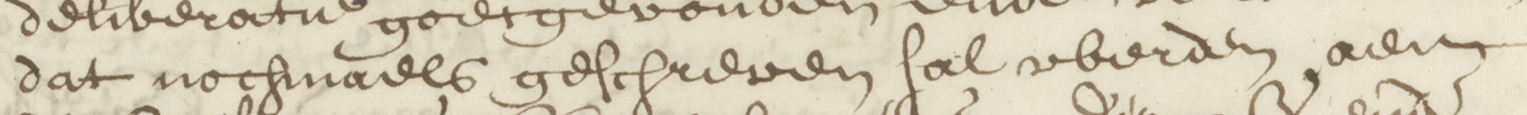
dat nochmaels geschreven sal werden aen
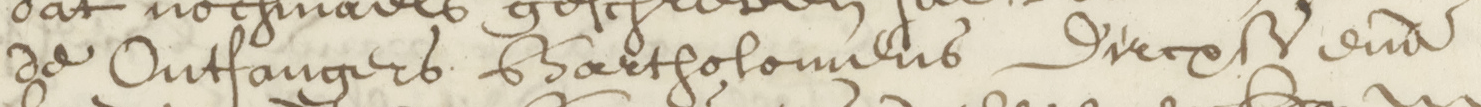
de Ontfangers Bartholomeus Dircxsz ende
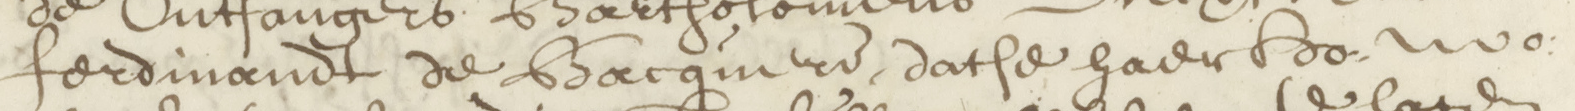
ferdinandt de Bacquere, datse haer Ho:Mo:
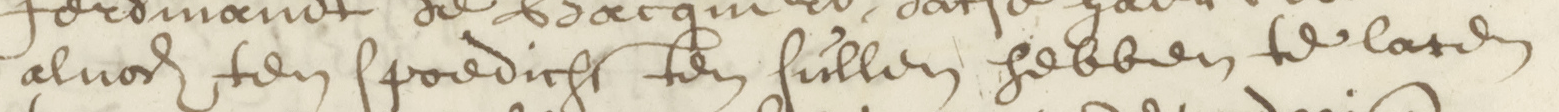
alnoch ten spoedichsten sullen hebben te laten
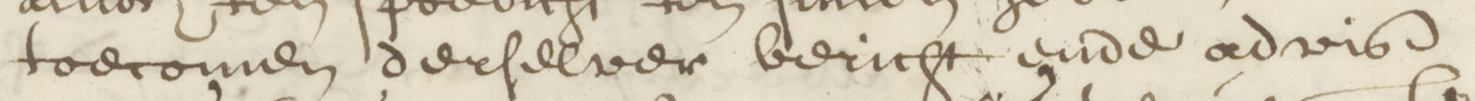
toecomen derselver bericht ende advis
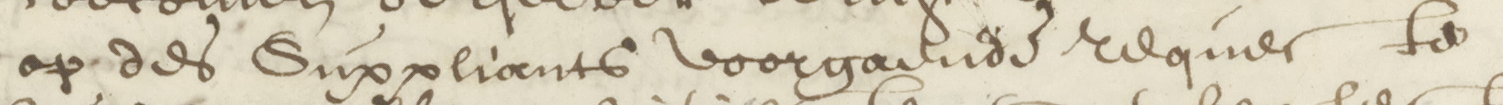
op des Suppliants voorgaende requeste
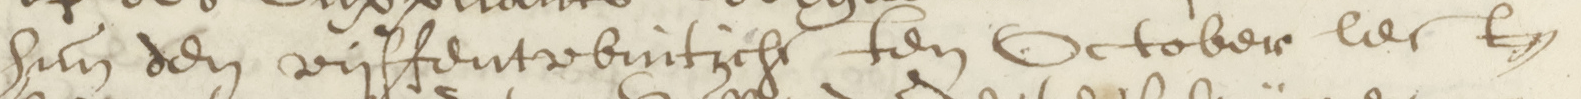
hun den vijffentwintichsten October lest„
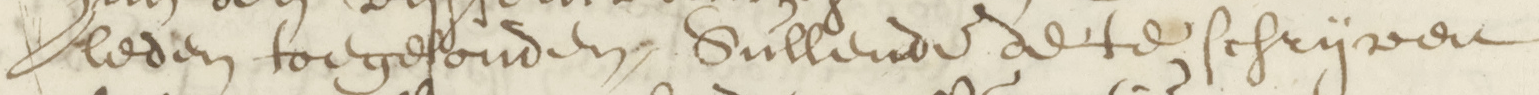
leden toegesonden, Sullende de te schrijven
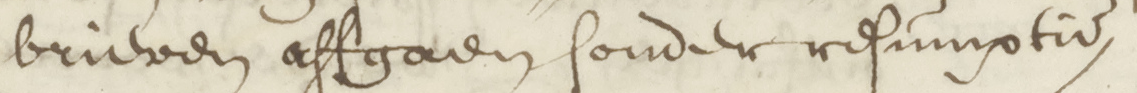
brieven affgaen sonder resumptie.
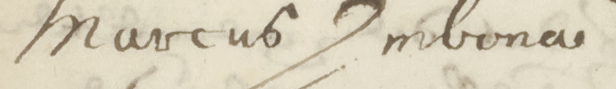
Marcus Imbona
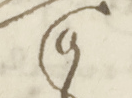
ca.
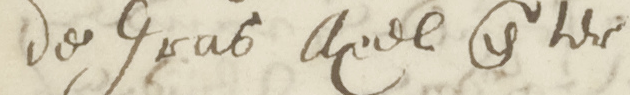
de Gras Axel & ter
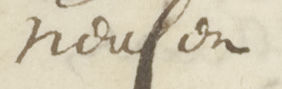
neusen
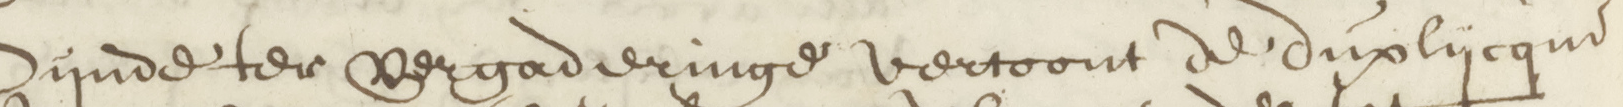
Sijnde ter Vergaderinge vertoont de duplijcque
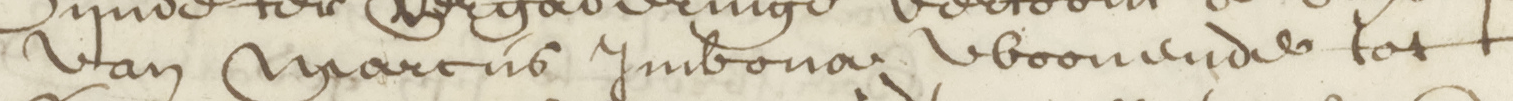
van Marcus Imbona, Woonende tot
